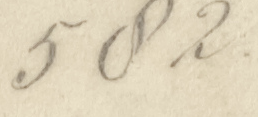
582.
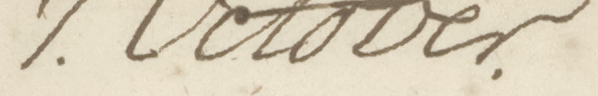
7. October.
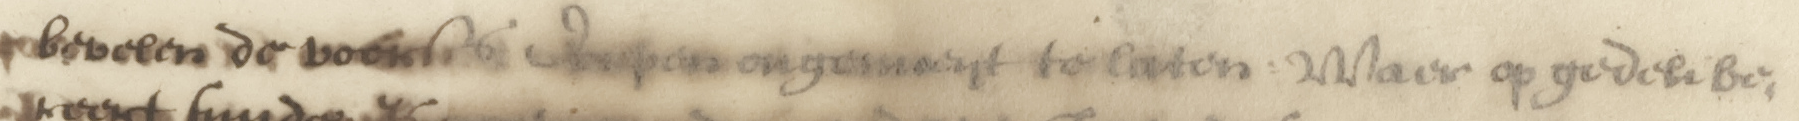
bevelen de voors dorpen ongemoeyt te laten. Waer op gedelibe„
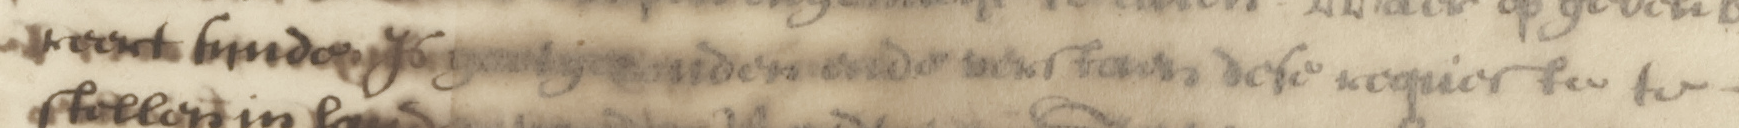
reert synde is goetgevonden ende verstaen dese requeste te
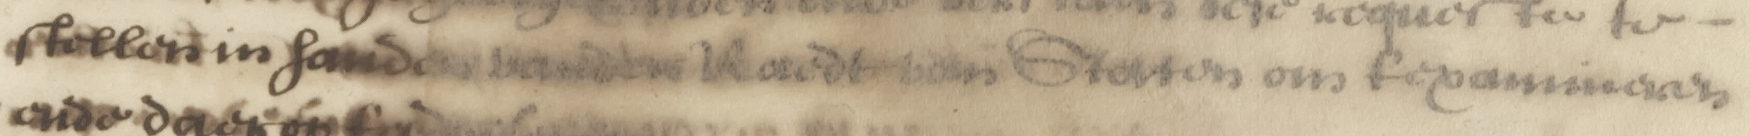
stellen in handen van den Raedt van Staten om t‛examineren
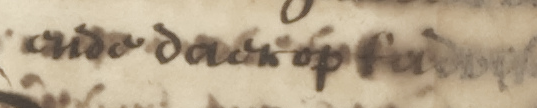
ende daerop te adviseren
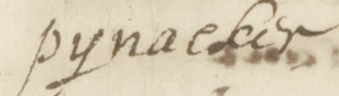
pynacker
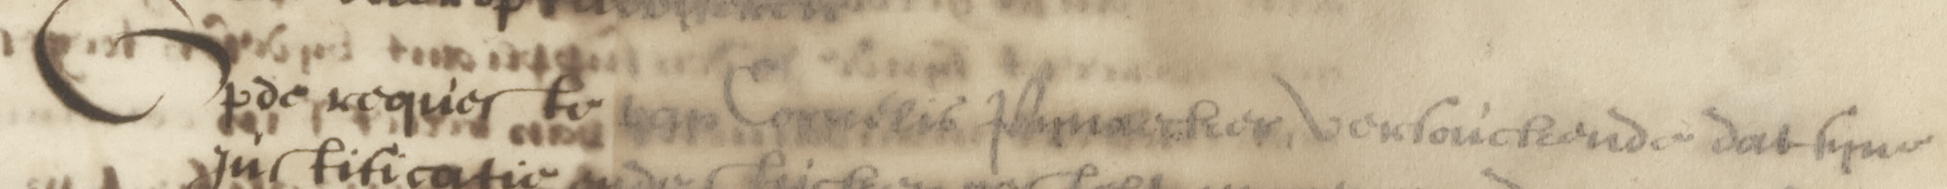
Op de requeste van Cornelis Pynaecker versouckende dat syne
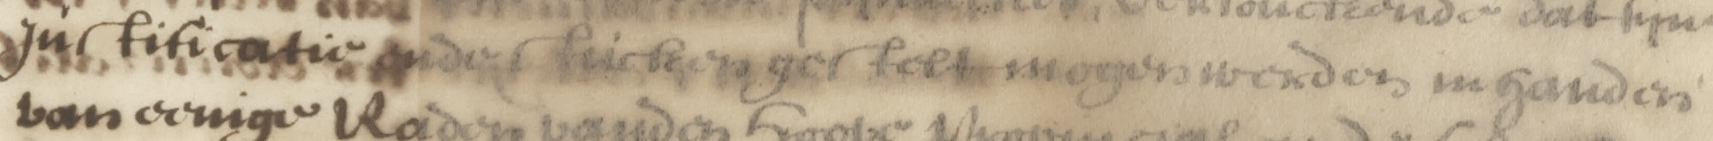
justificatie ende stucken gestelt mogen werden in handen
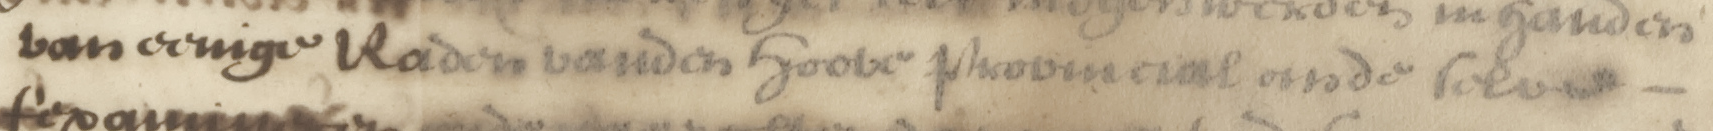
van eenige Raden vanden Hoove Provinciael om de selve -
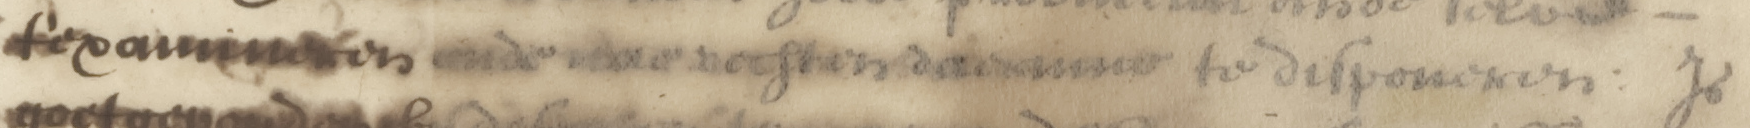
t'examineren ende nae rechten daerinne te disponeren: Is
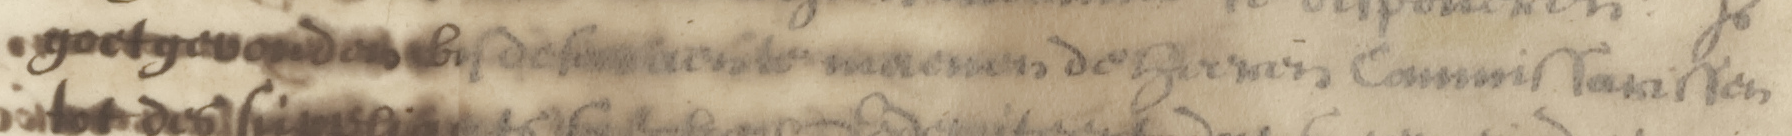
goetgevonden by de selue te maenen de heeren Commissarissen
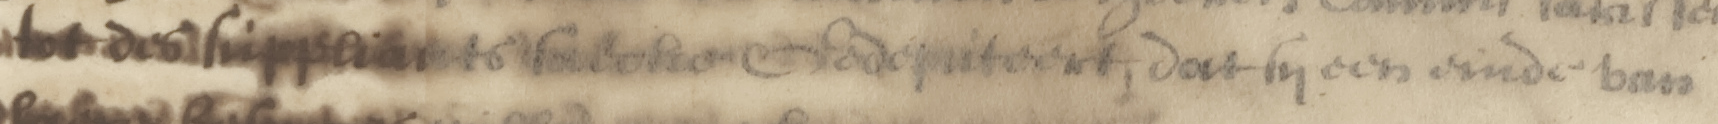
tot des suppliants saecke Gedeputeert, dat sy een einde van
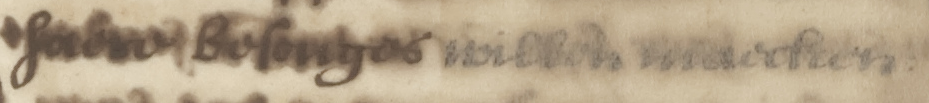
haere besonges willen maecken
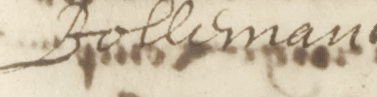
Bolleman
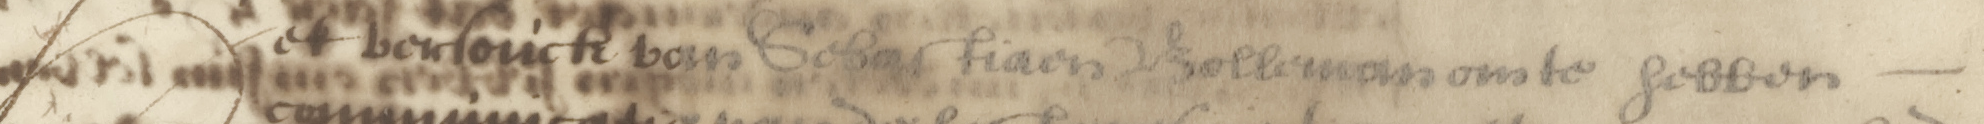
Het versouck van Sebastiaen Bolleman om te hebben -
